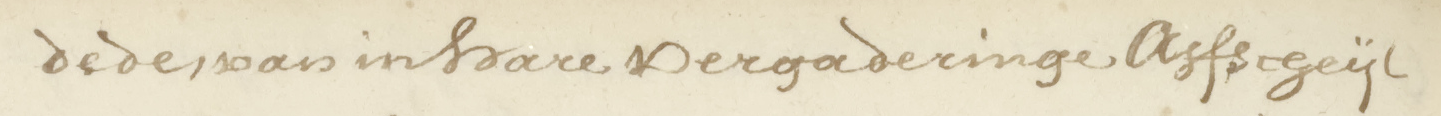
dede van in hare vergaderinge affscheijt
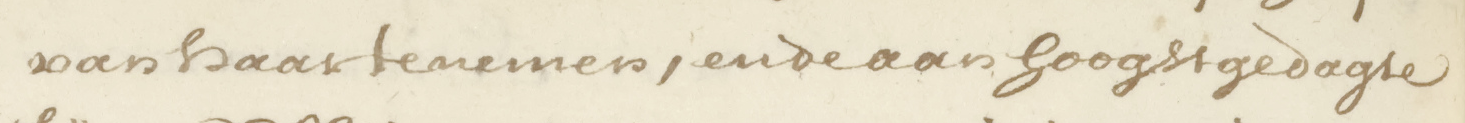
van haar te nemen, ende aan hoogstgedagte
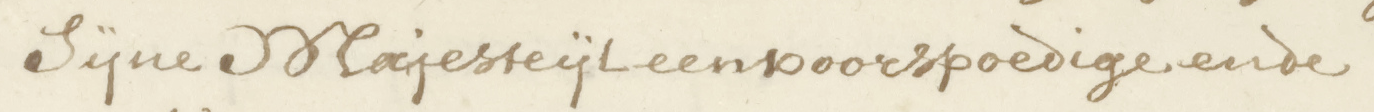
Sijne Majesteijt een voorspoedige ende
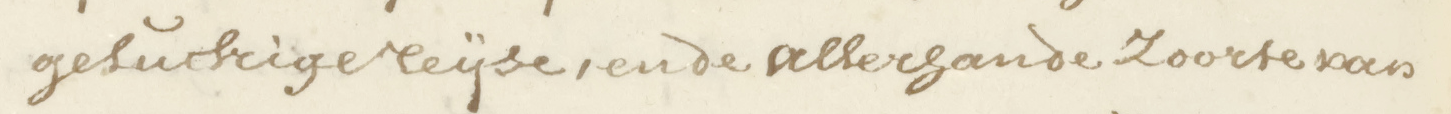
geluckige reijse ende allerhande zoorte van
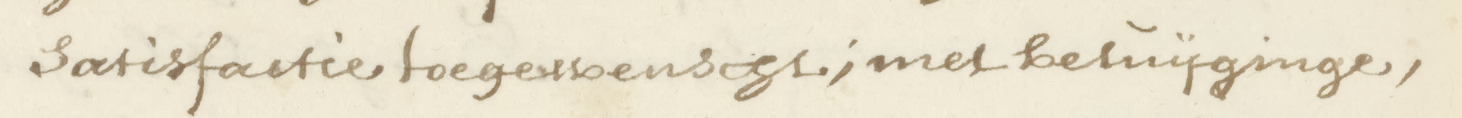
satisfactie toegewenscht; met betuijginge
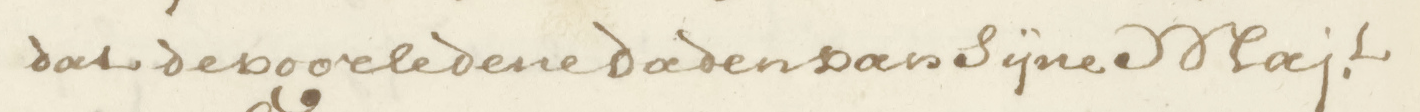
dat de voorledene daden van Sijne Majt
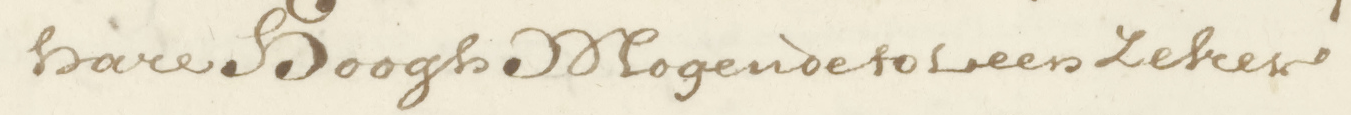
hare Hoogh Mogende tot een zeker
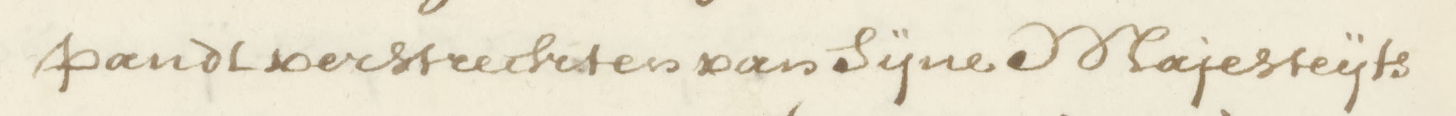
pandt verstreckten van Sijne Majesteijts
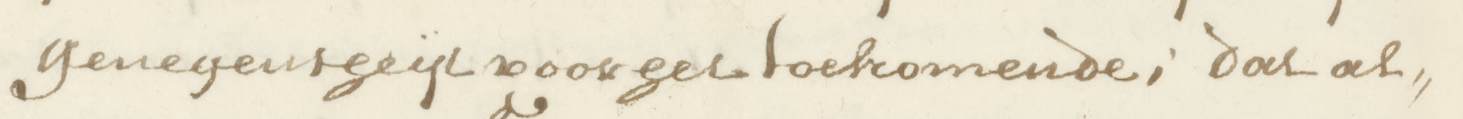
genegenthijt voor het toekomende; dat al„
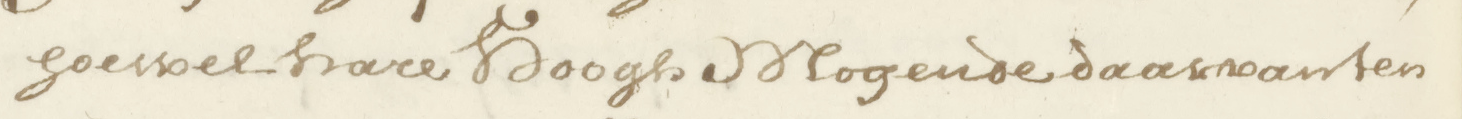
hoewel hare Hoogh Mogende daervan ten
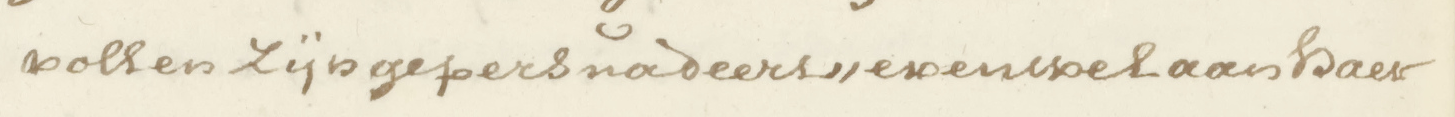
vollen zijn gepersuadeert, evenwel aan haer
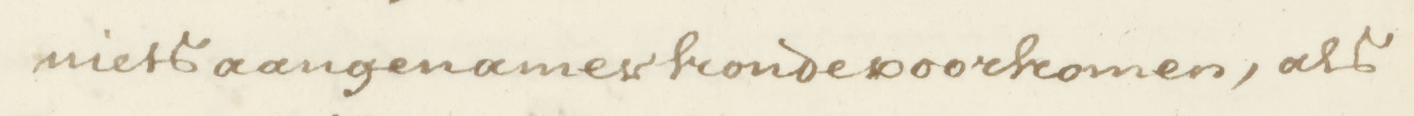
niets aangenamer konde voorkomen, als
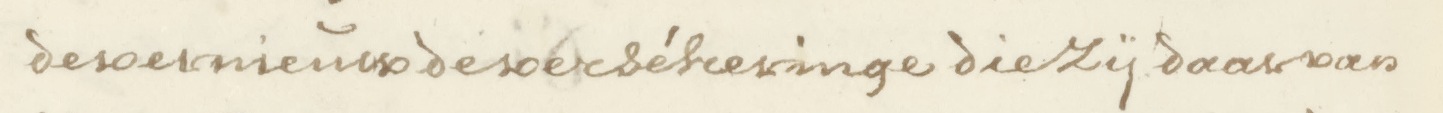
de vernieuwde versekeringe die zij daarvan
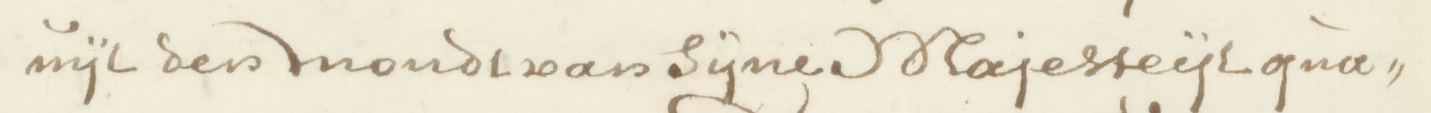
uijt den mondt van Sijne Majesteijt qua„
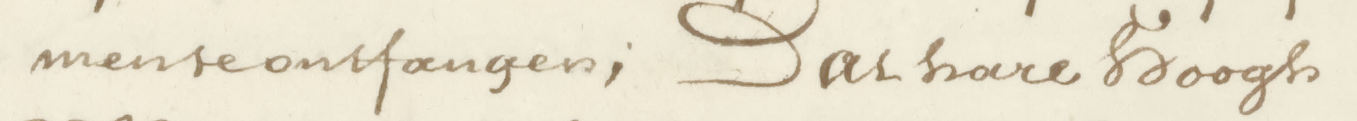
men te ontfangen; Dat hare Hoogh
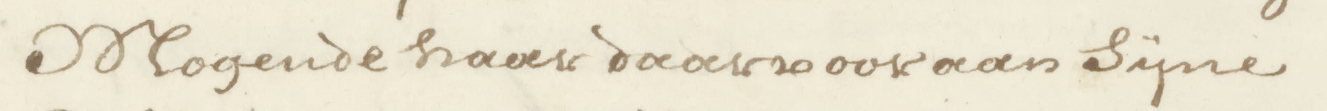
Mogende haar daarvoor aan Sijne
